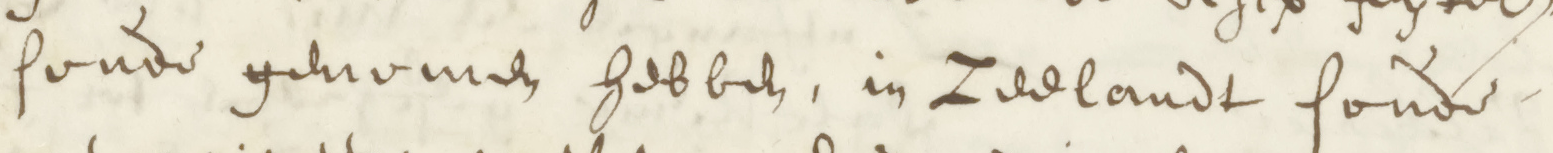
soude genomen hebben, in Zeelandt soude
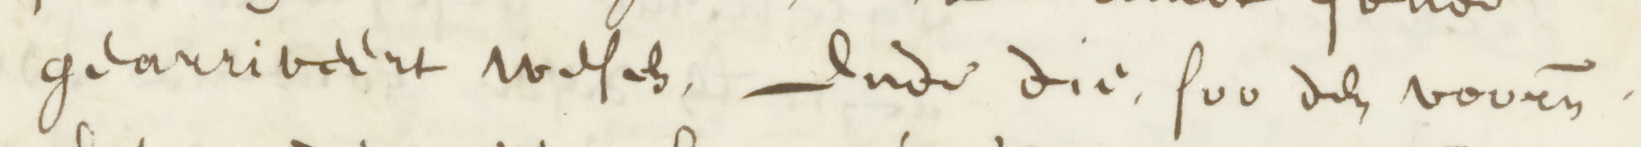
gearriveert wesen, ende die, soo den voorn
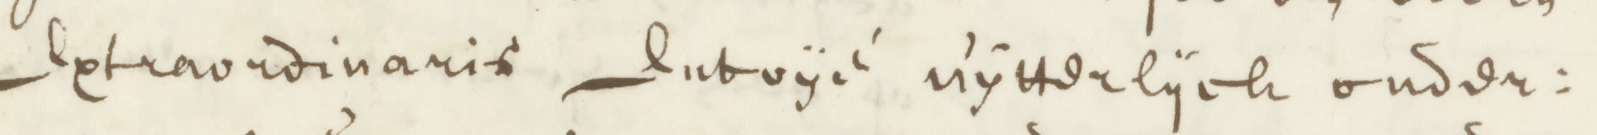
Extraordinaris Envoijé uijtterlijck onder:
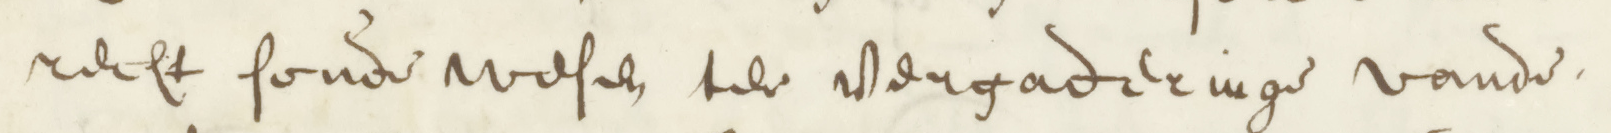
recht soude wesen ter Vergaderinge vande
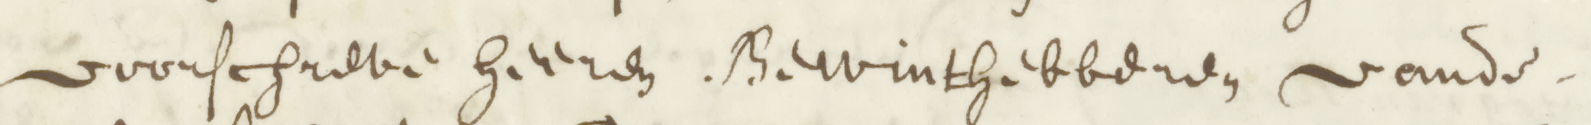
voorschreve heeren Bewinthebberen vande
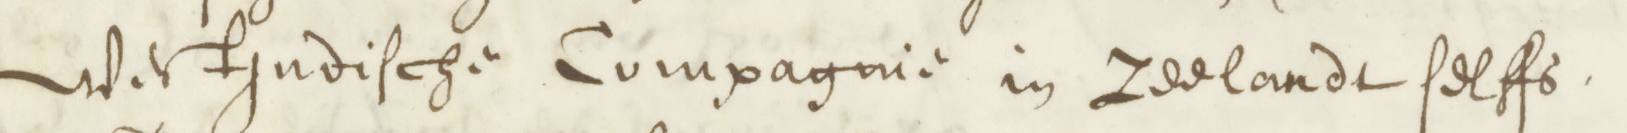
Westindische Compagnie in Zeelandt selffs
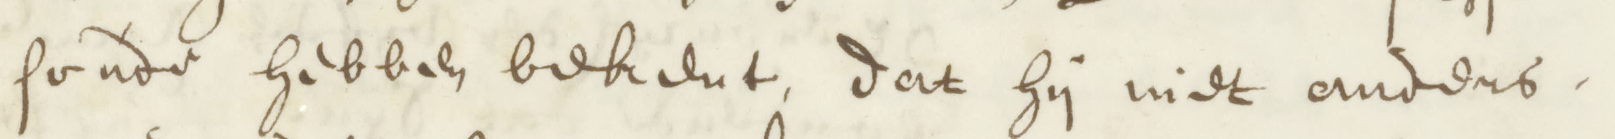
soude hebben bekent, dat hij niet anders
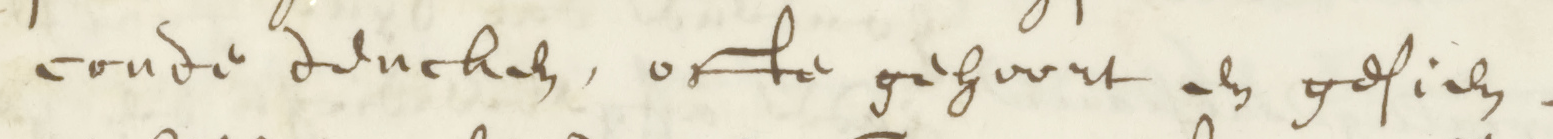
conde dencken, ofte gehoort en gesien
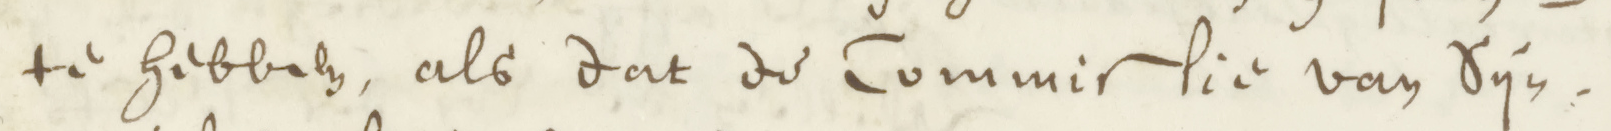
te hebben, als dat de Commissie van Sijn
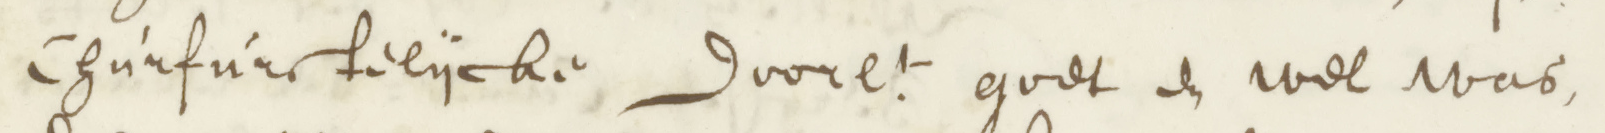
Churfurstelijcke Doorlt. goet en wel was,
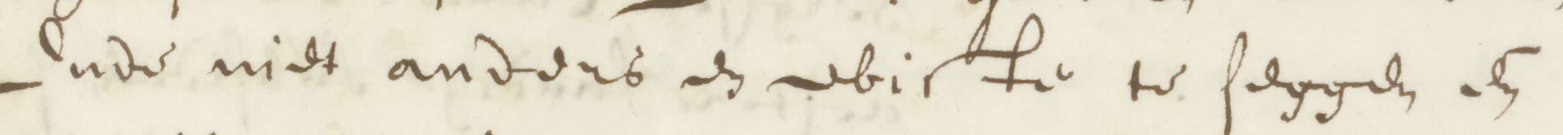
ende niet anders en wiste te seggen en
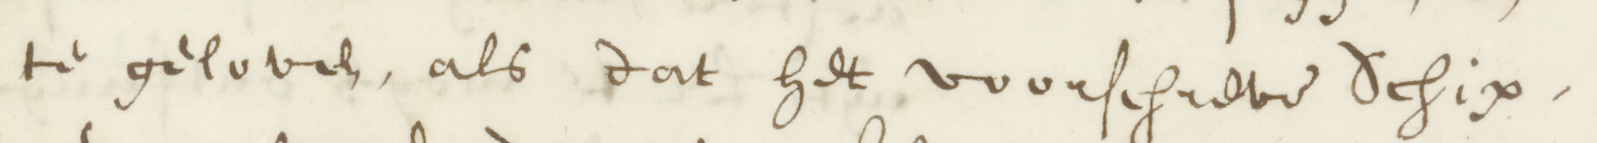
te geloven, als dat het voorschreve Schip,
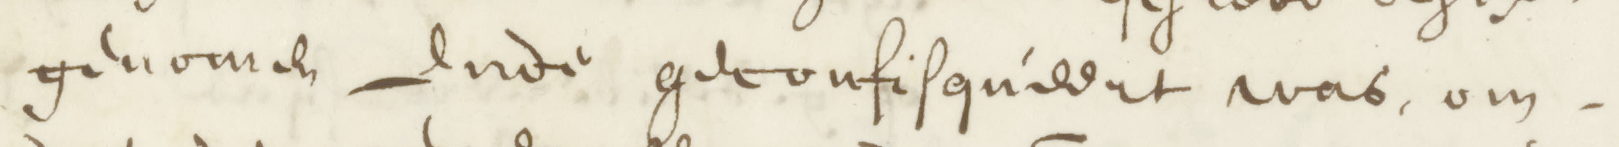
genomen ende geconfisqueert was, om
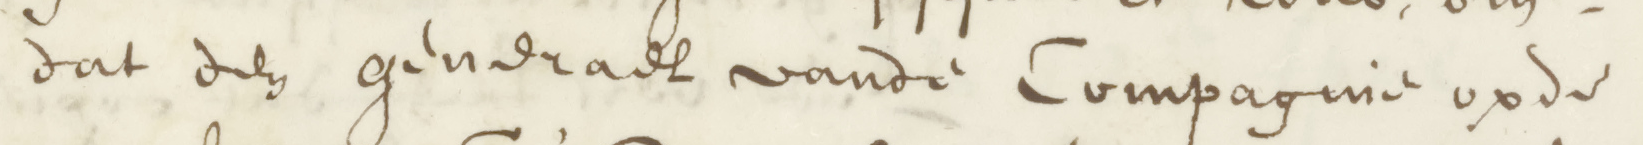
dat den generael vande Compagnie opde
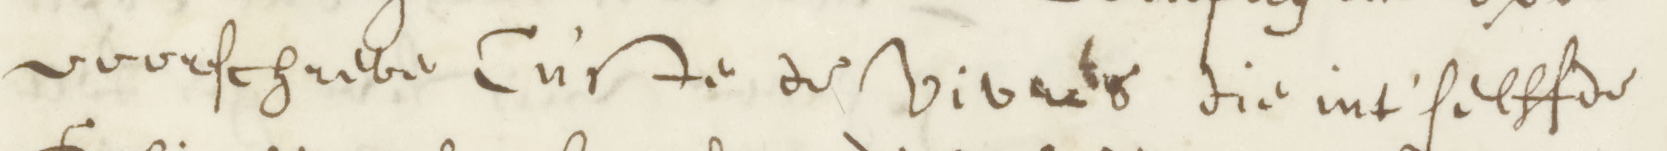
voorschreve Custe de Vivres die int' selffde
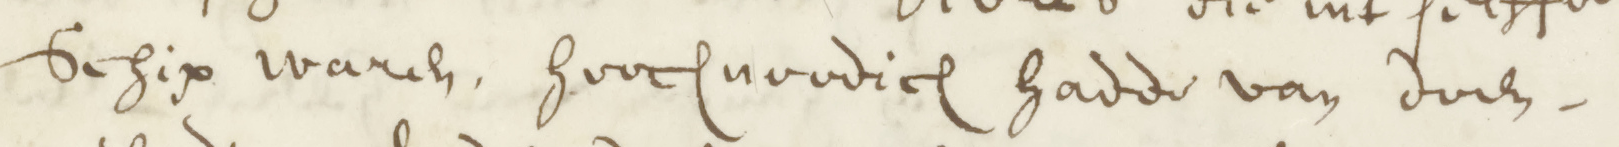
Schip waren, hoochnoodich hadde van doen -
